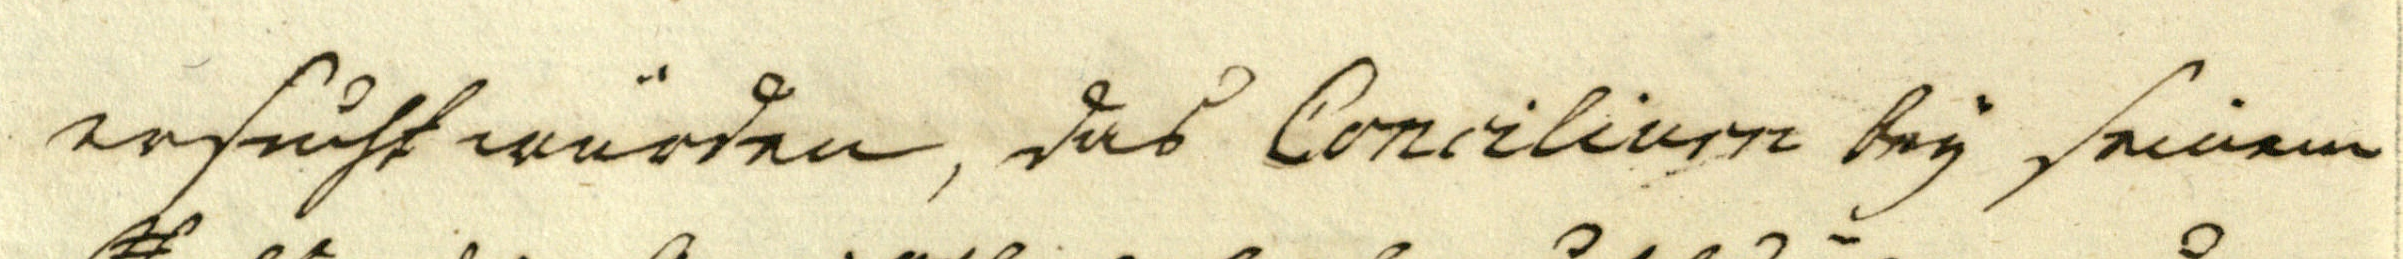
ersucht würden, das Concilium bey seinem
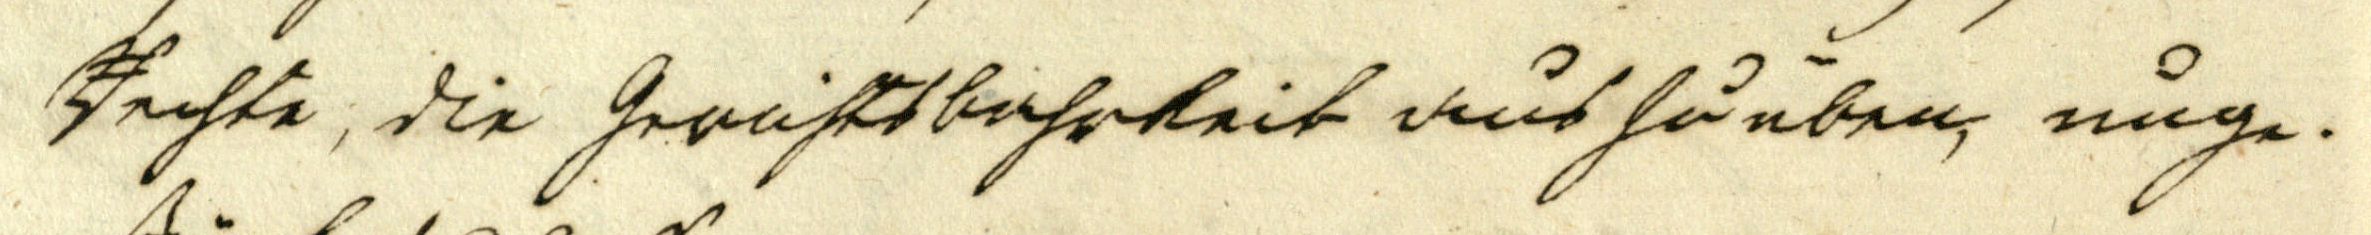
Rechte, die Gerichtsbahrkeit aus zu üben unge¬
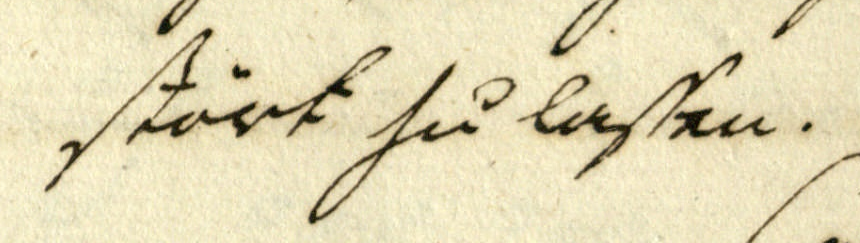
stört zu lassen.
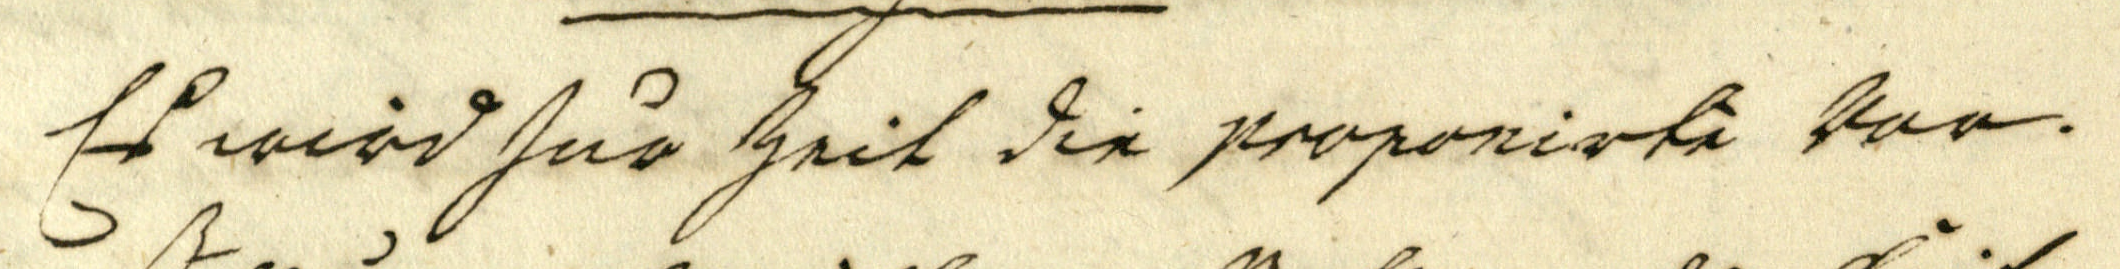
Es wird zur Zeit die proponirte Vor¬
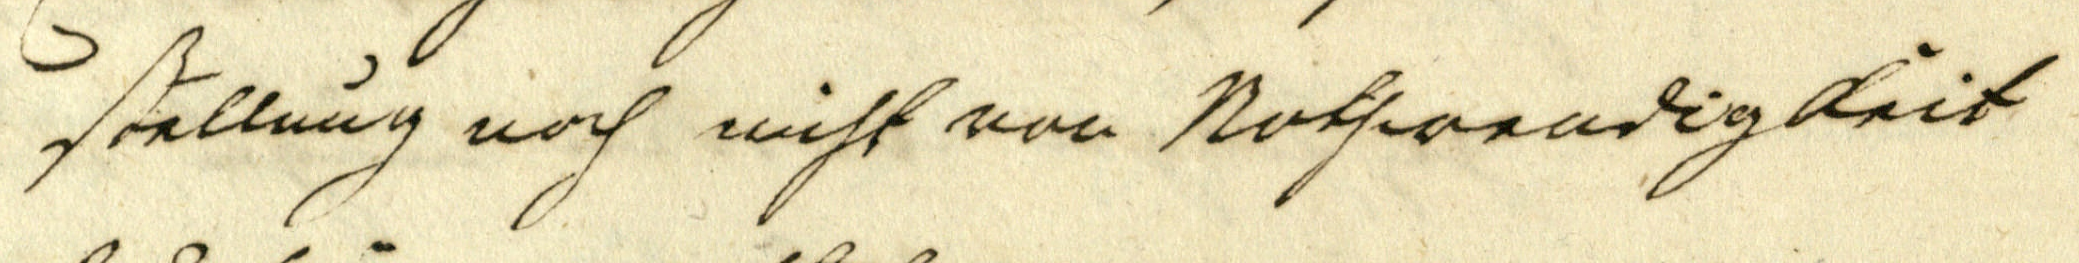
stellung noch nicht von Nothwendigkeit
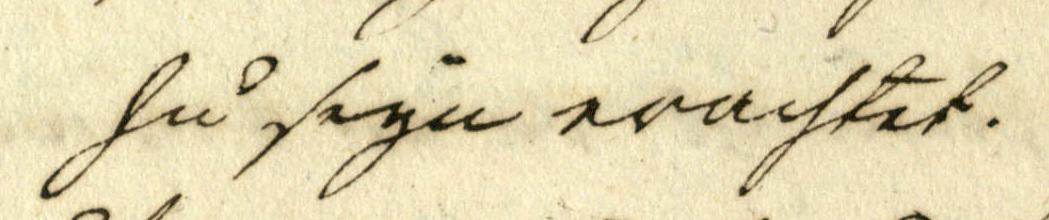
zu seÿn erachtet.
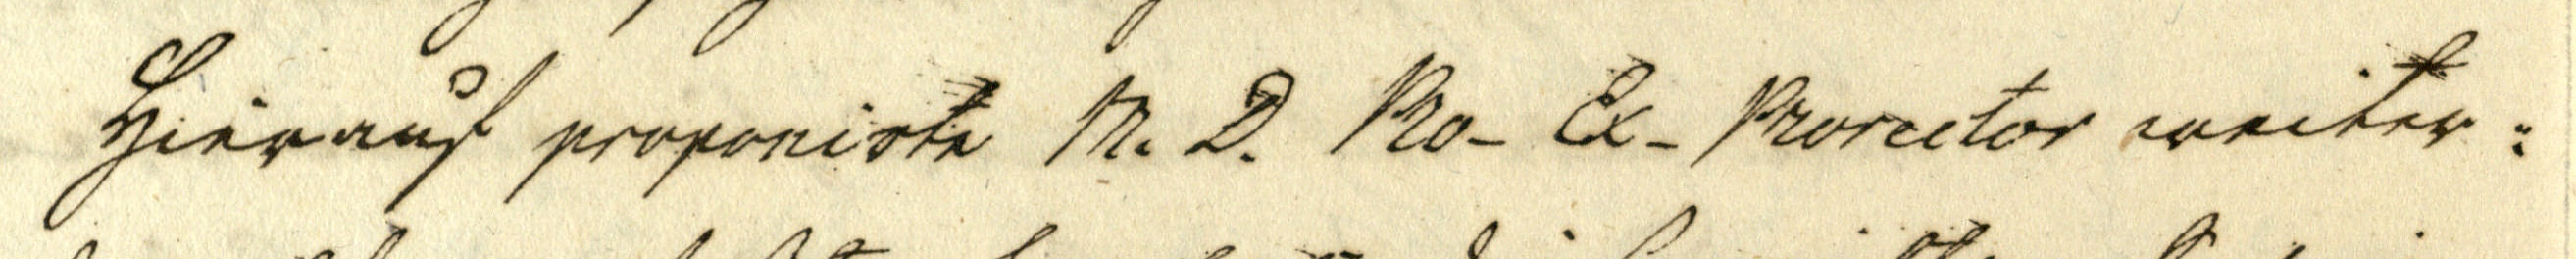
Hierauf proponirte M. D. Pro Ex. Prorector weiter:
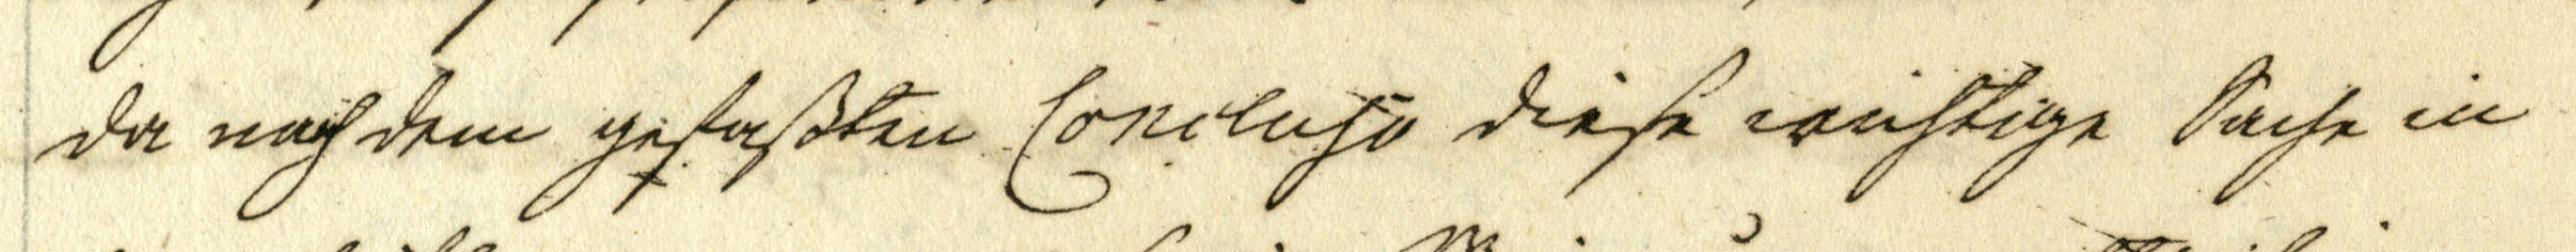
da nach dem gefaßten Concluso diese wichtige Sache in
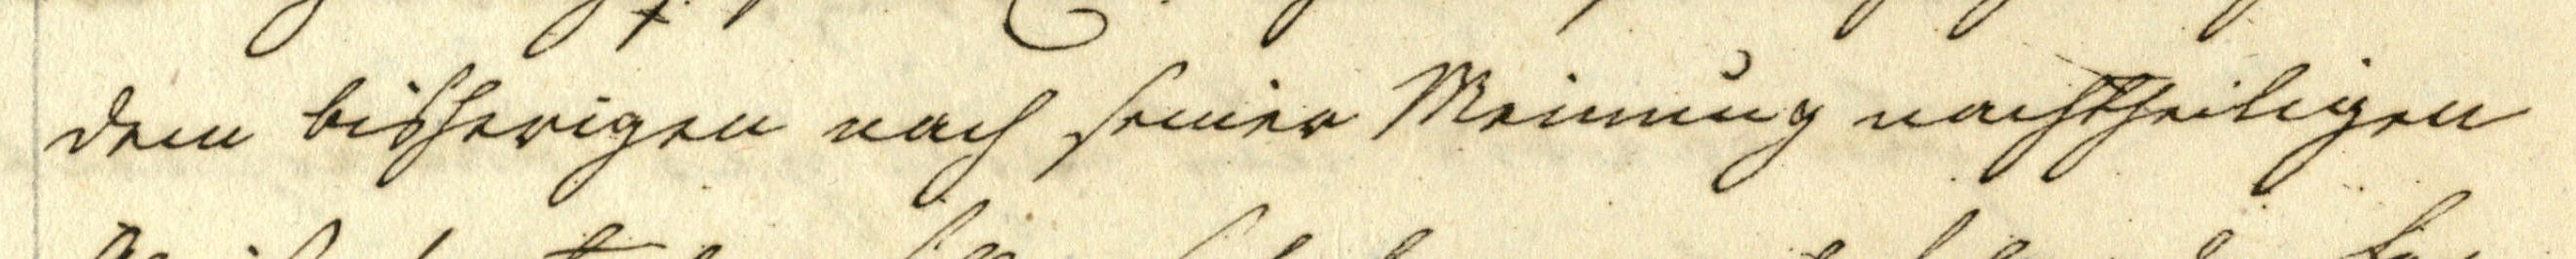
dem bisherigen nach seiner Meinung nachtheiligen
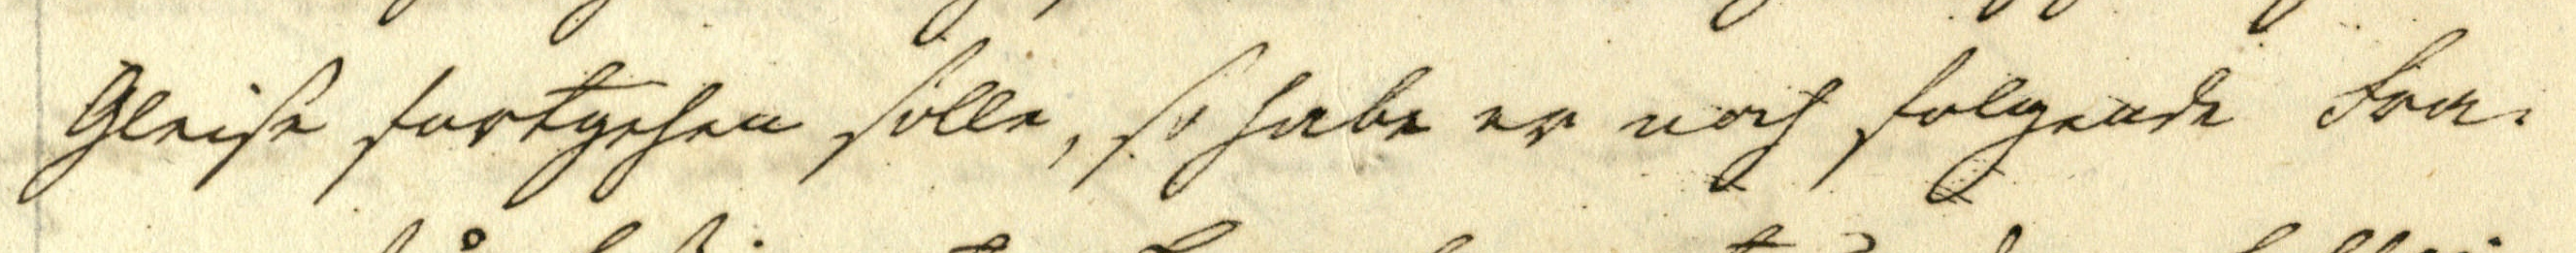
Gleise fortgehen solle, so habe er noch folgende Fra¬
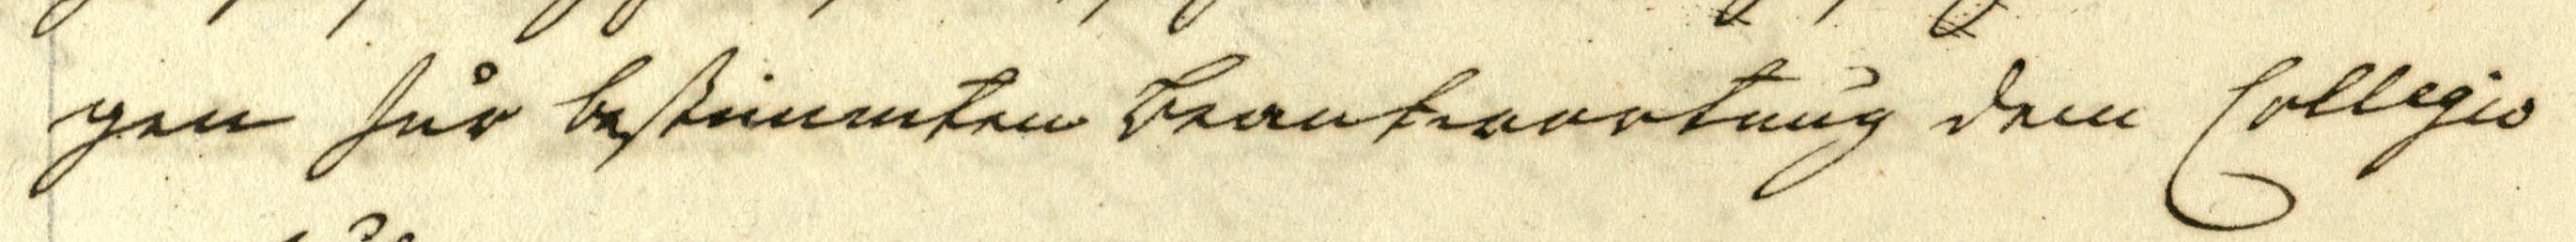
gen zur bestimmten Beantwortung dem Collegio
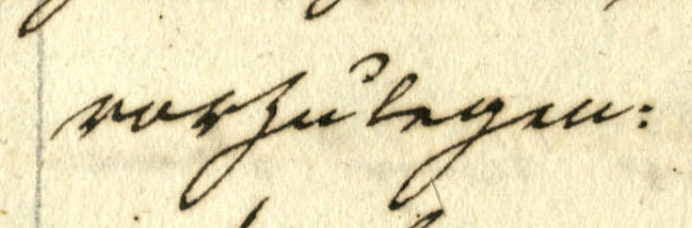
vorzulegen:
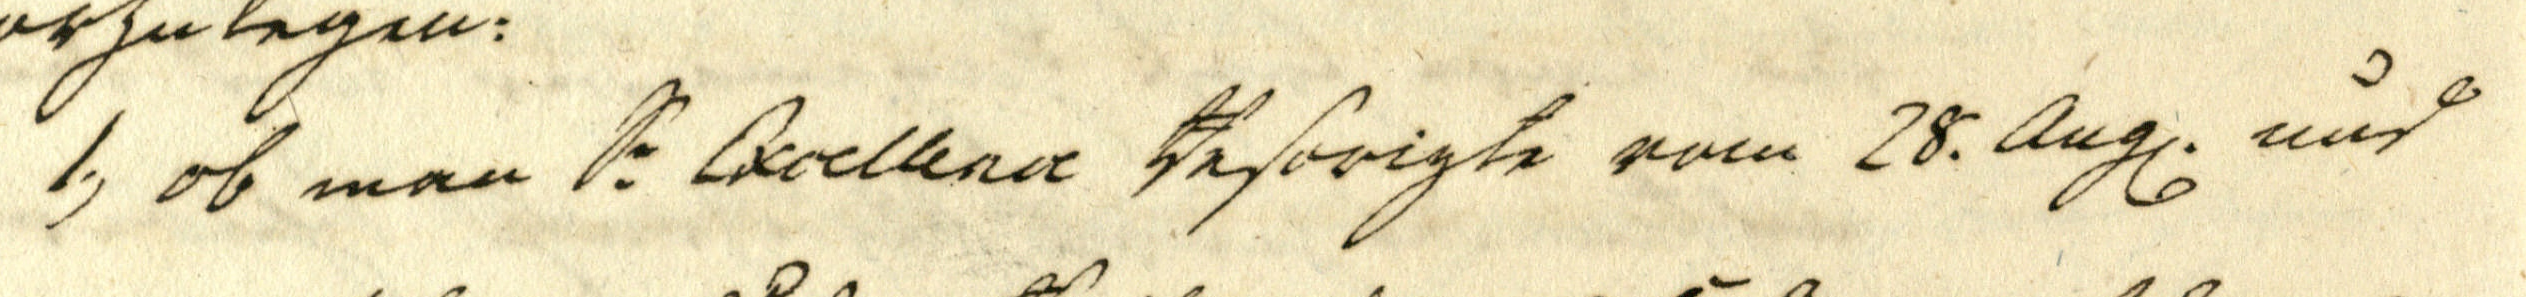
1., ob man Sr Excellence Rescripte vom 28. Aug. und
